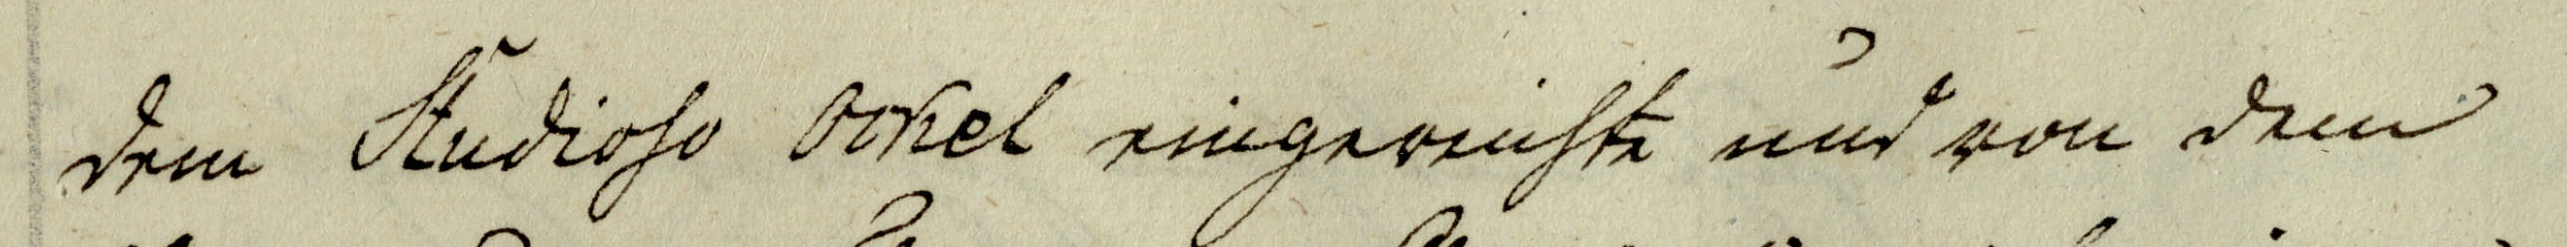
dem Studioso Ockel eingereichte und von dem
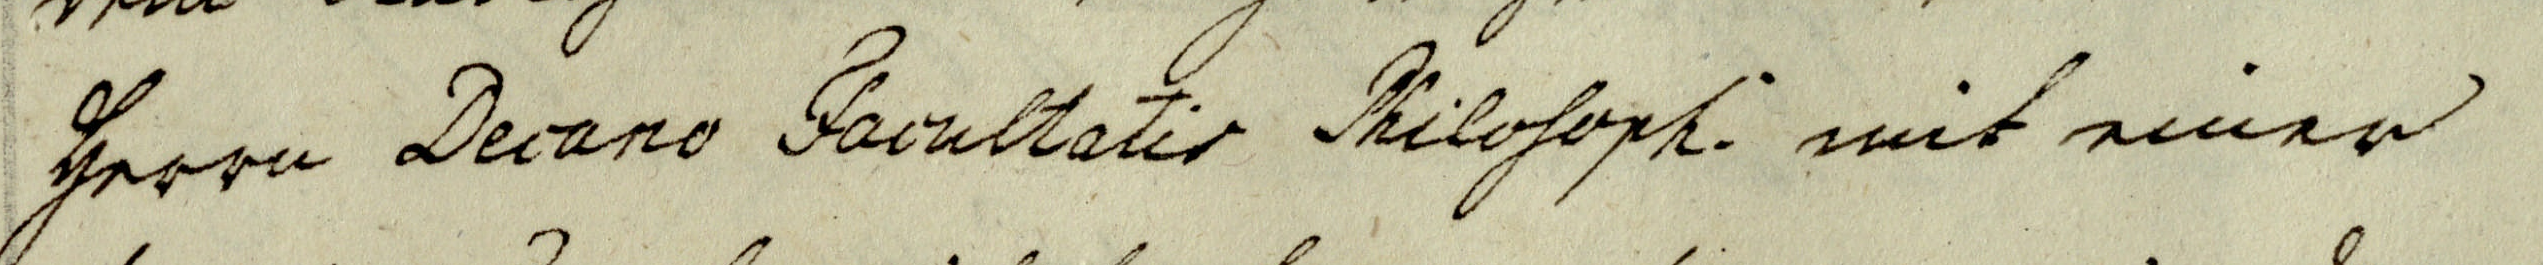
Herrn Decano Facultatis Philosoph. mit einer
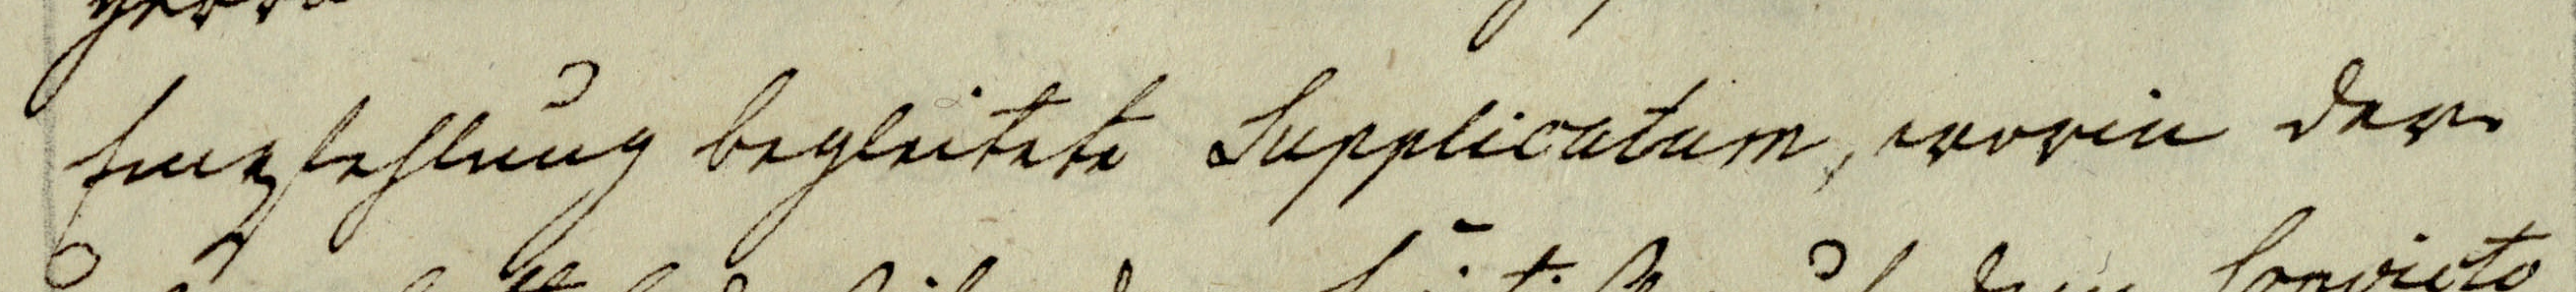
Empfehlung begleitete Supplicatum, worin der¬
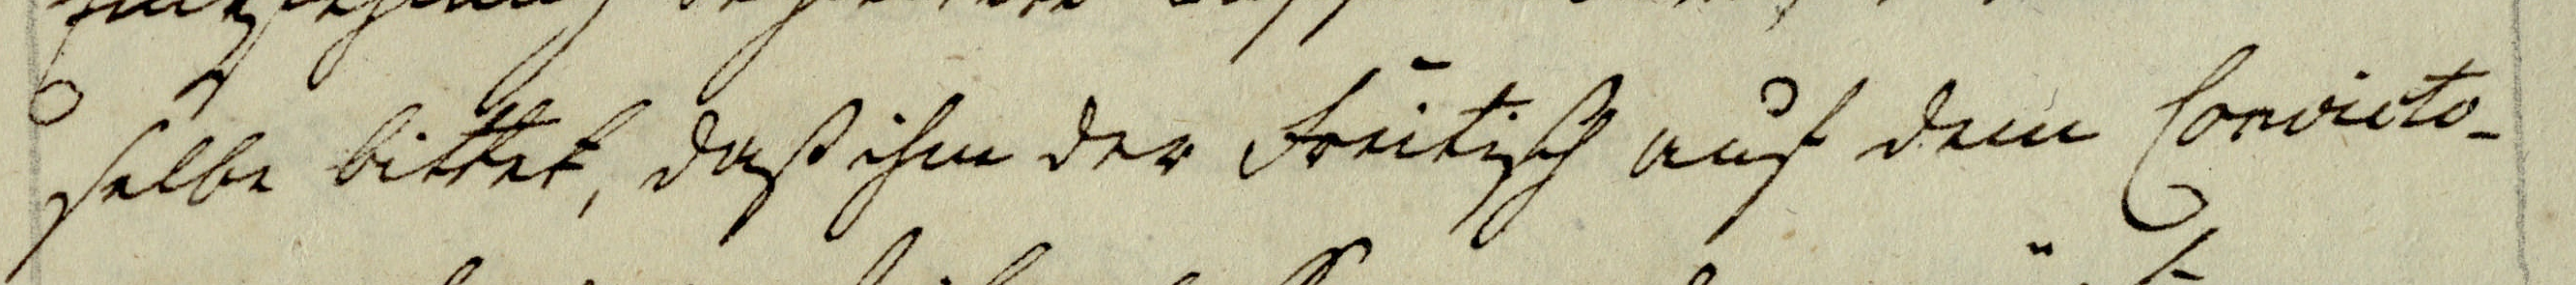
selbe bittet, daß ihm der Freitisch auf dem Convicto¬
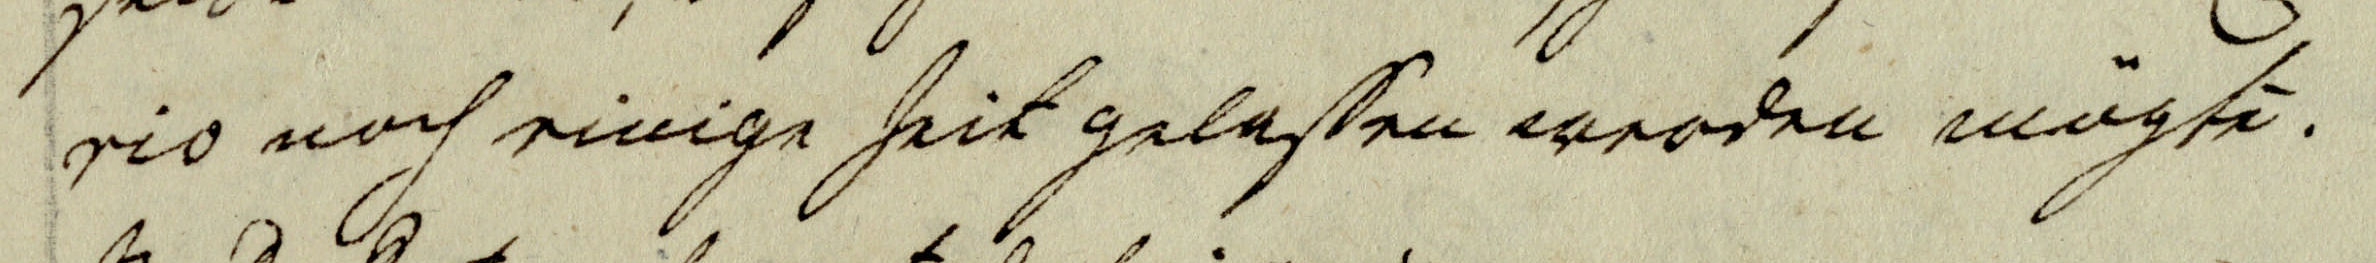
rio noch einige Zeit gelassen werden mögte.
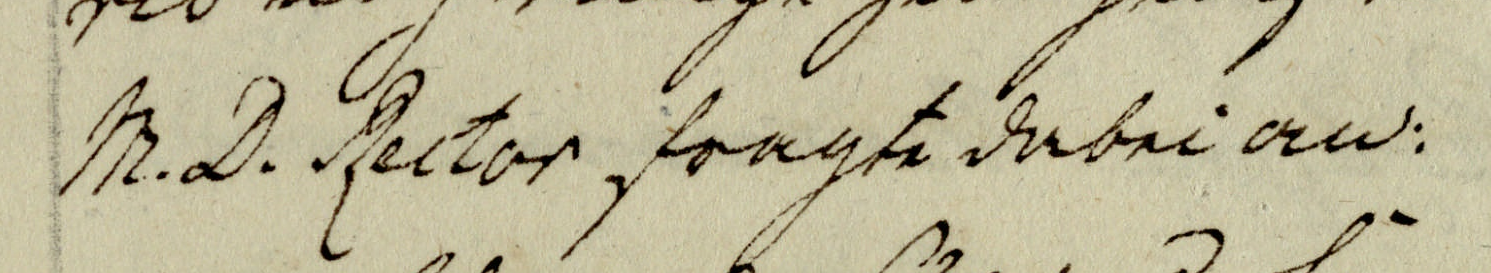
M. D. Rector fragte dabei an:
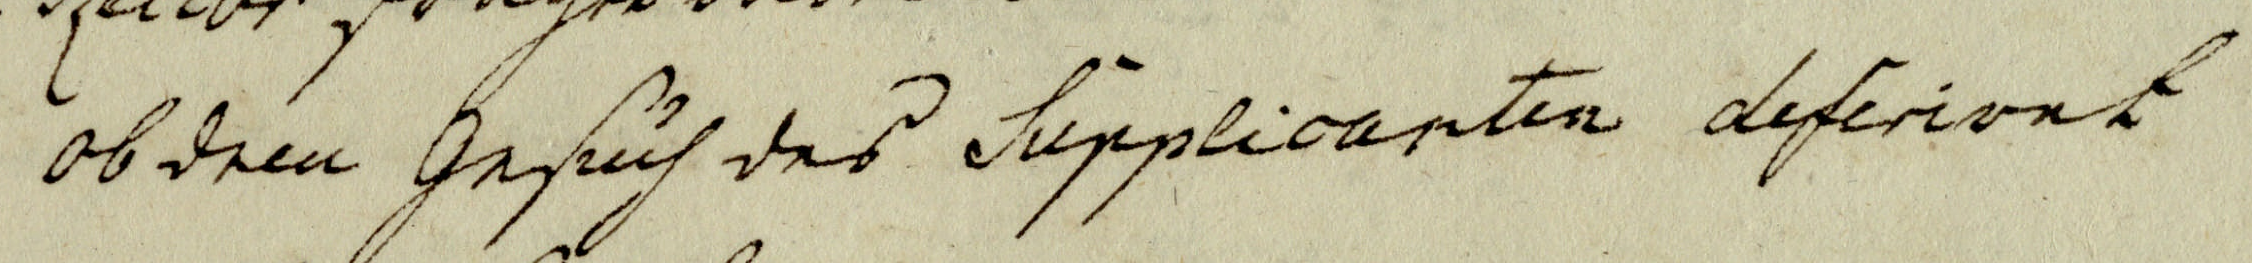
ob dem Gesuch des Supplicanten deferiret
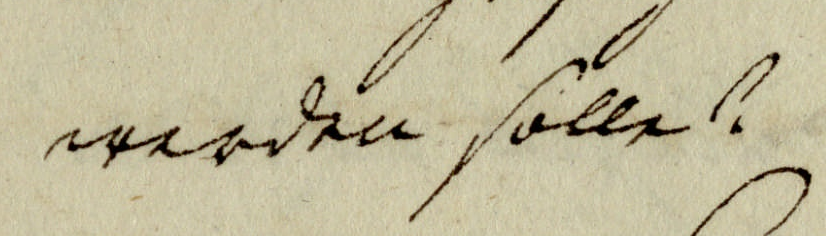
werden solle?
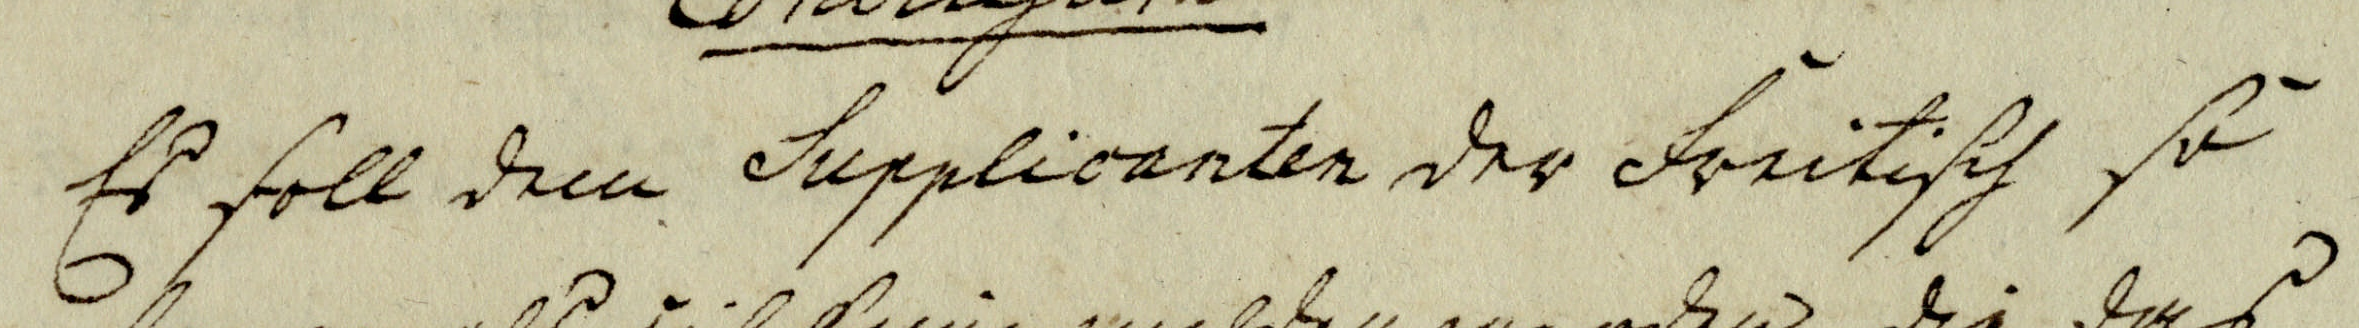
Es soll dem Supplicanten der Freitisch so
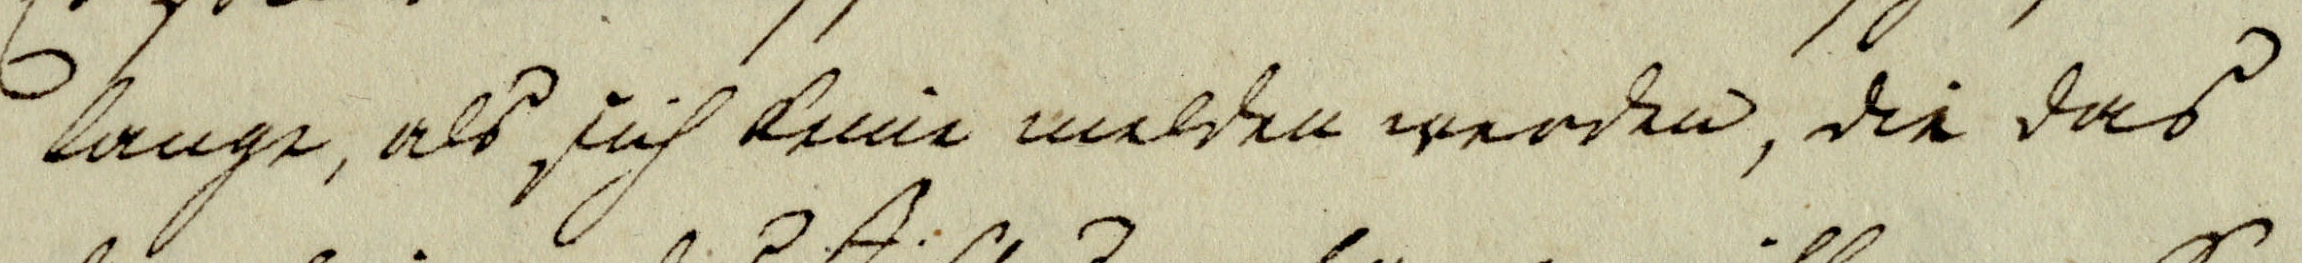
lange, als sich keine melden werden, die das
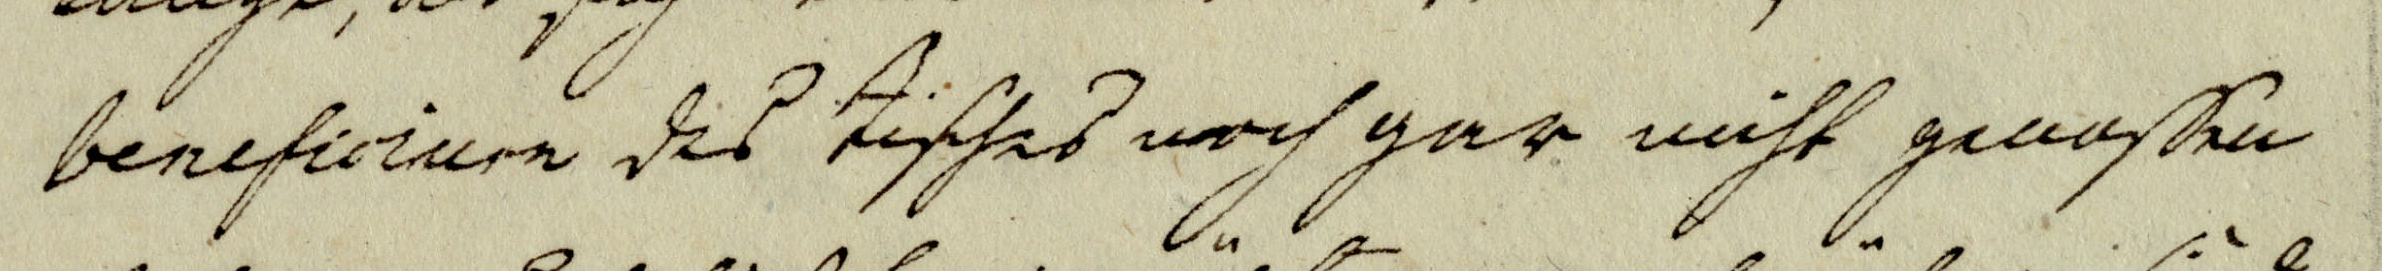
beneficium des Tisches noch gar nicht genossen
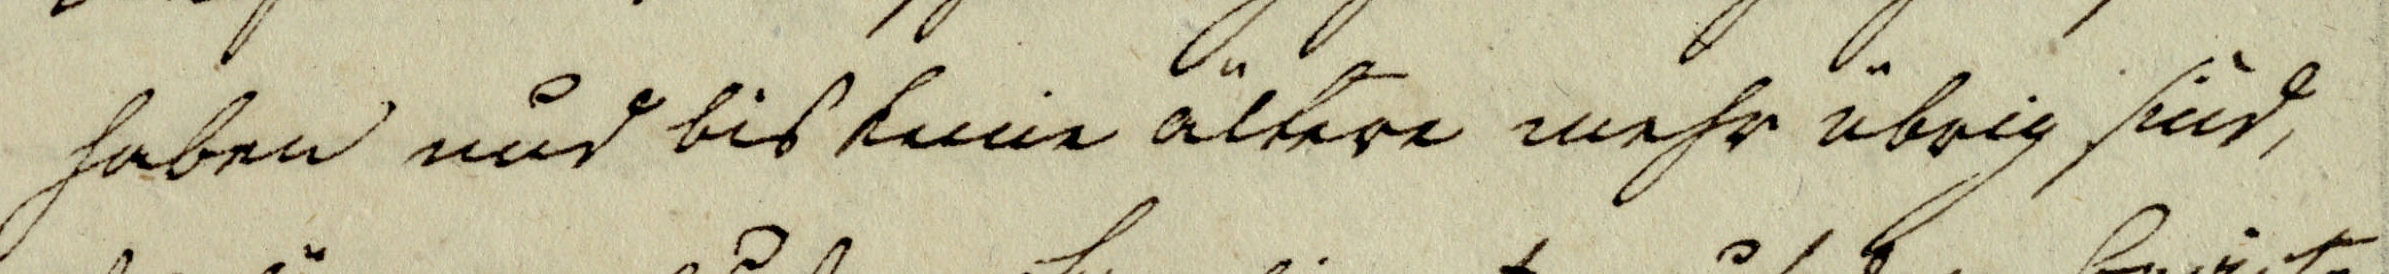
haben und bis keine ältere mehr übrig sind,
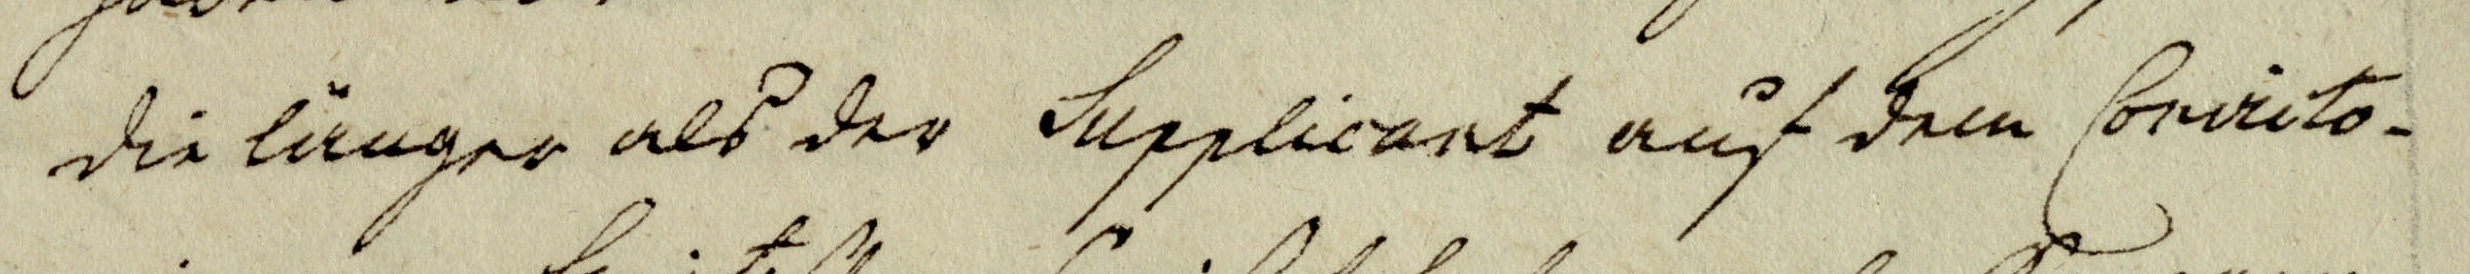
die länger als der Supplicant auf dem Convicto¬
